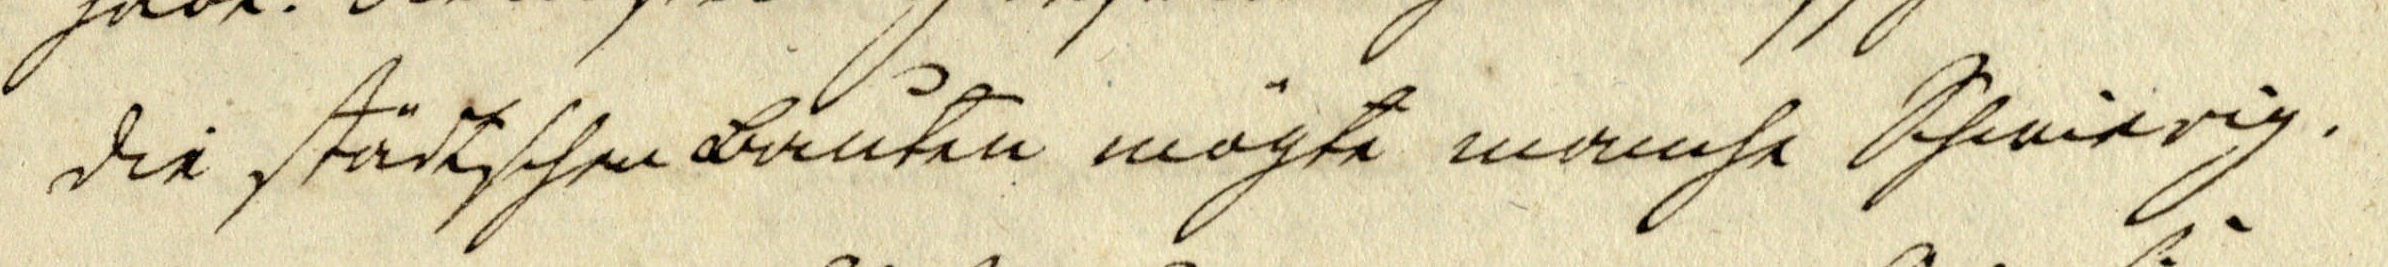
die städtschen Bauten mögte manche Schwierig¬
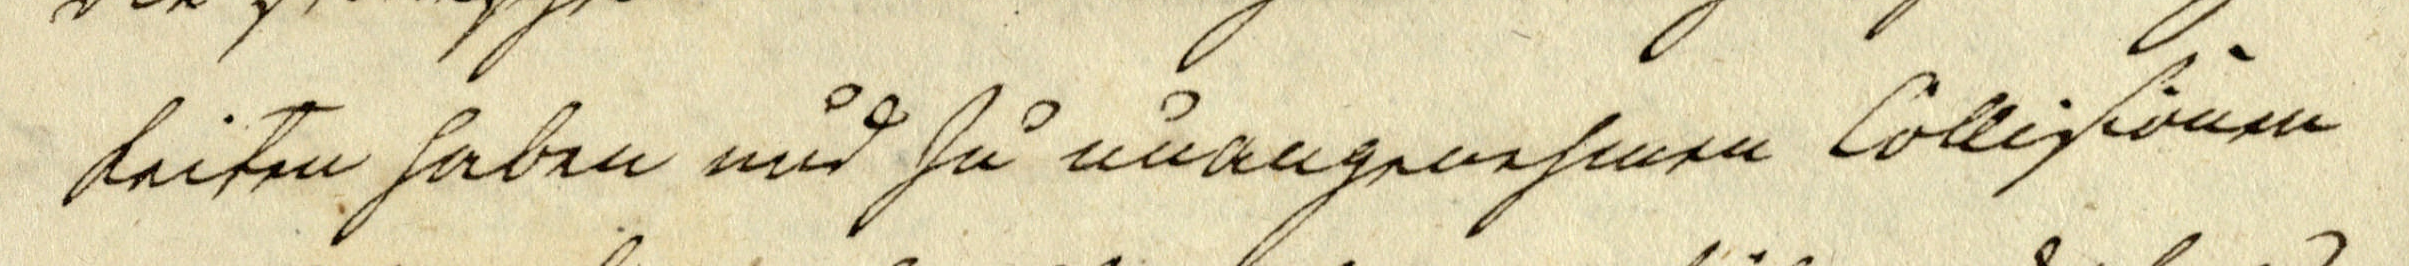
keiten haben und zu unangenehmen Collisionen
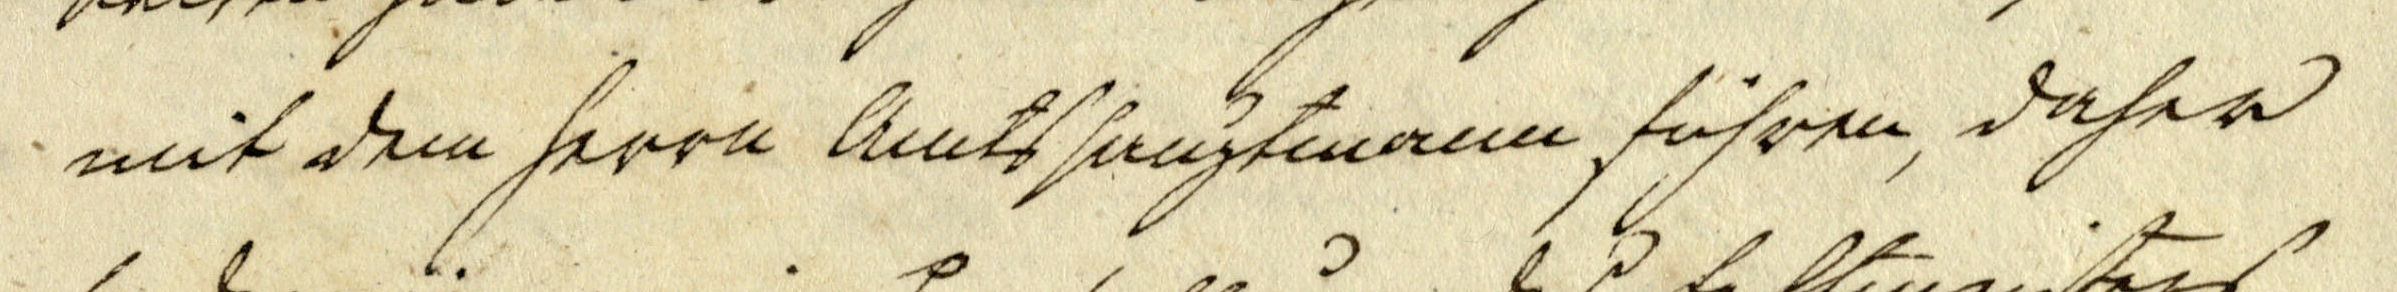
mit dem Herrn Amtshauptmann führen, daher
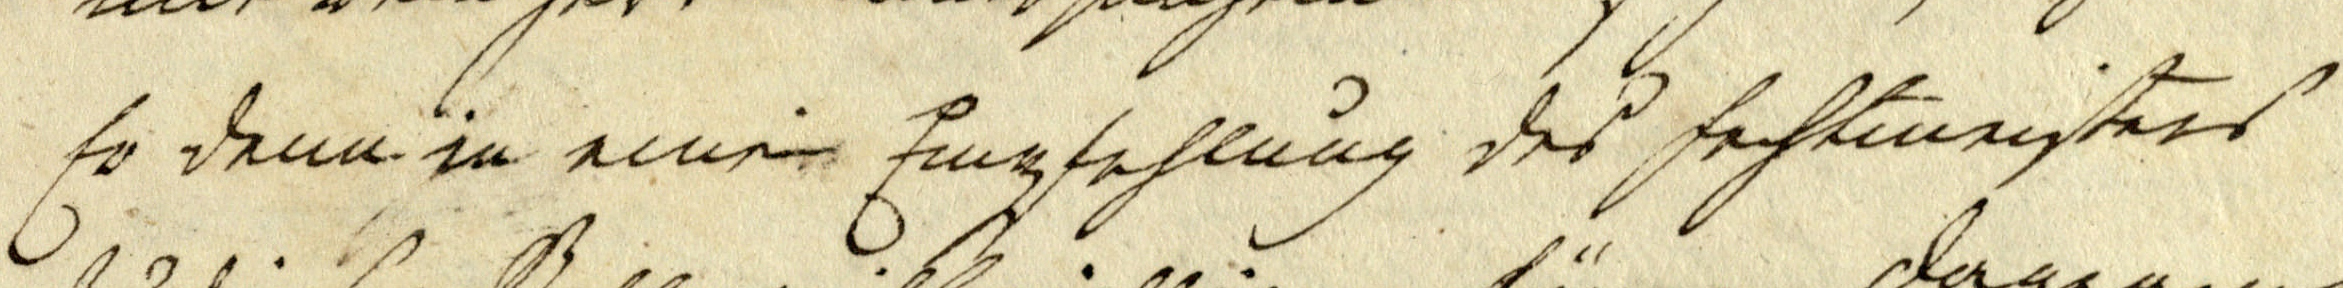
Er denn in eine Empfehlung des Fechtmeisters
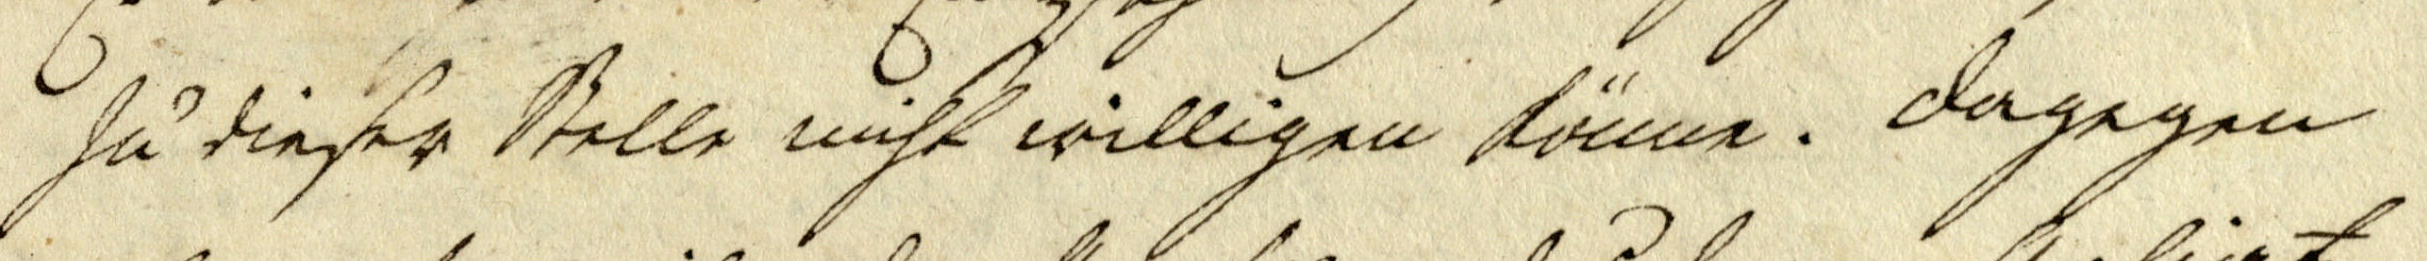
zu dieser Stelle nicht willigen könne. Dagegen
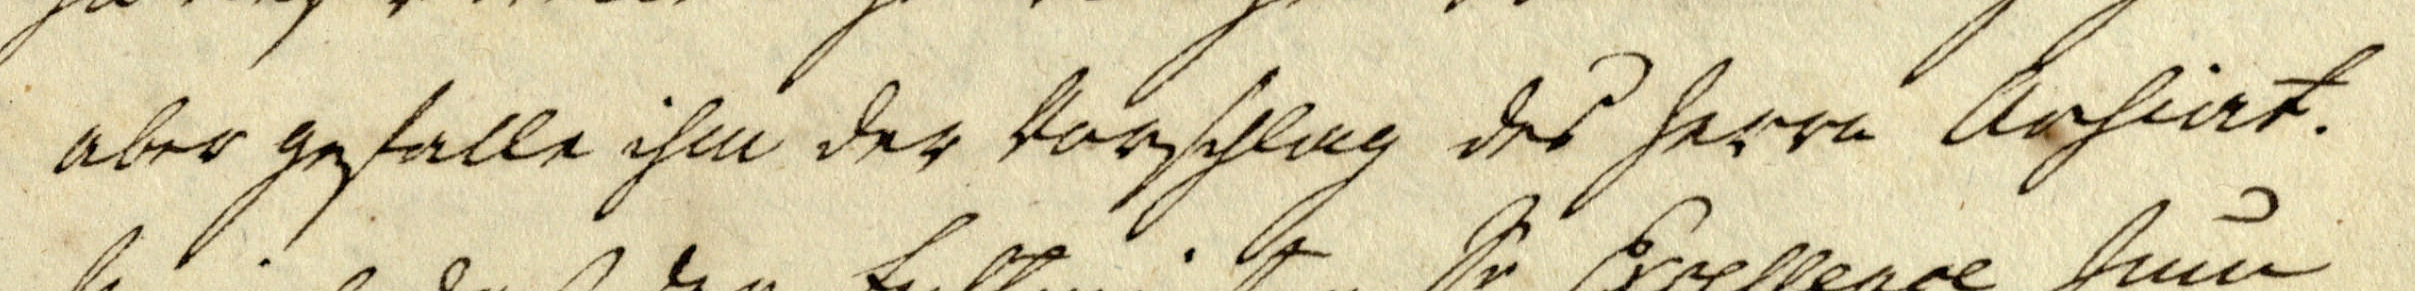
aber gefalle ihm der Vorschlag des Herrn Arhiat¬
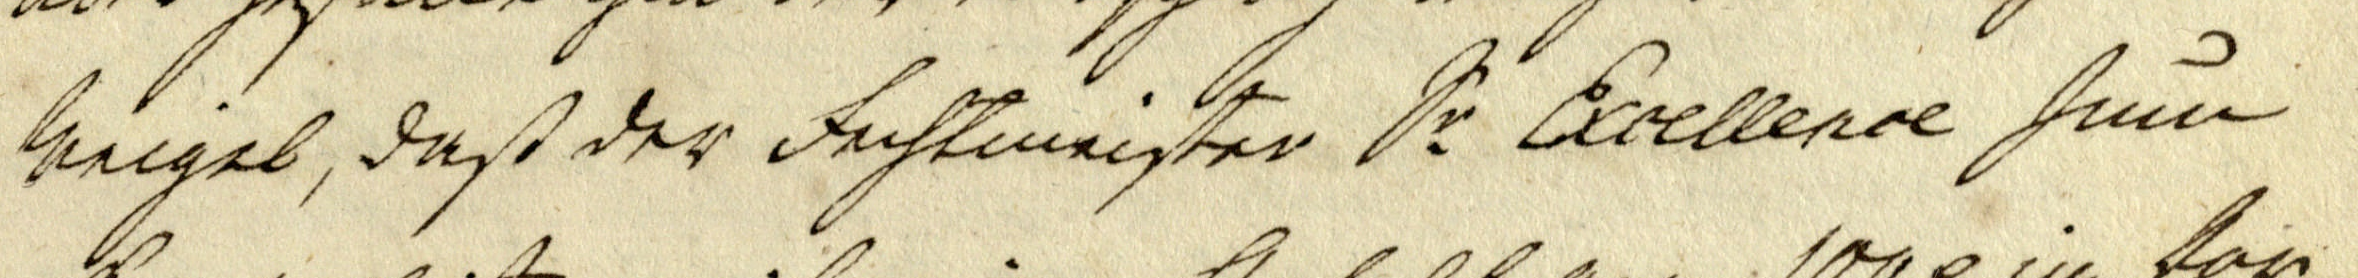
Weigel, daß der Fechtmeister Sr Excellence zum
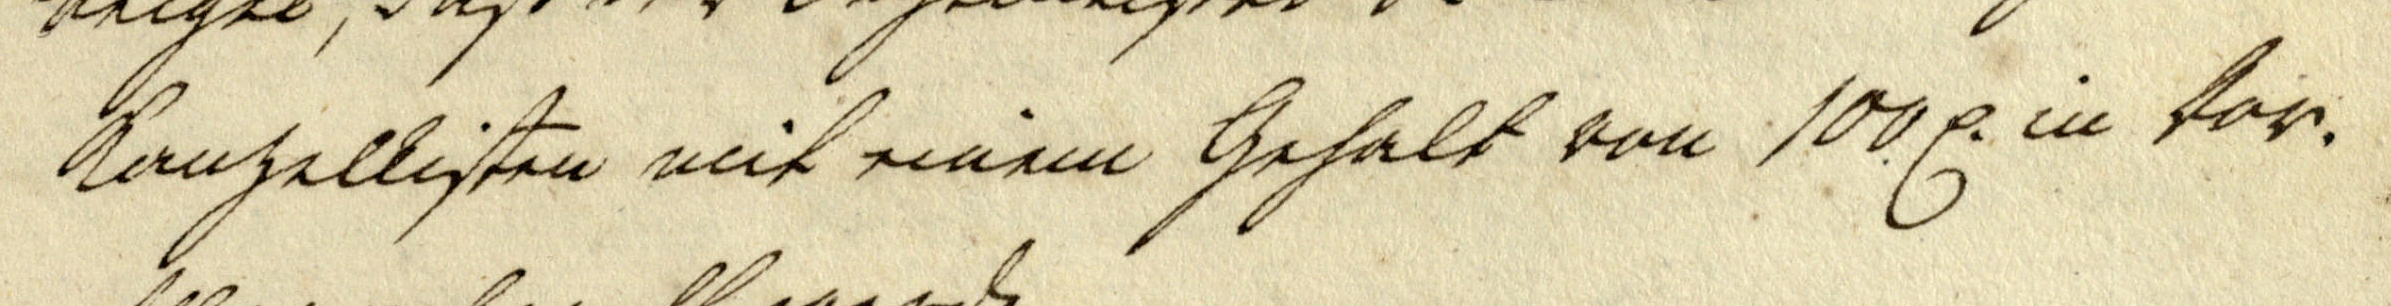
Kanzellisten mit einem Gehalt von 100 l. in Vor¬
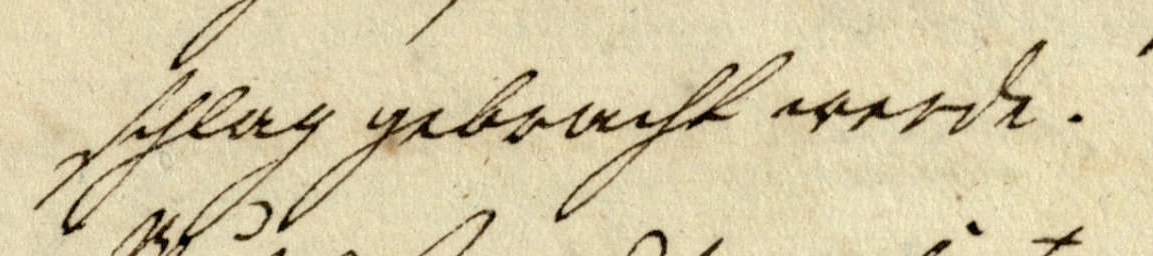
schlag gebracht werde.
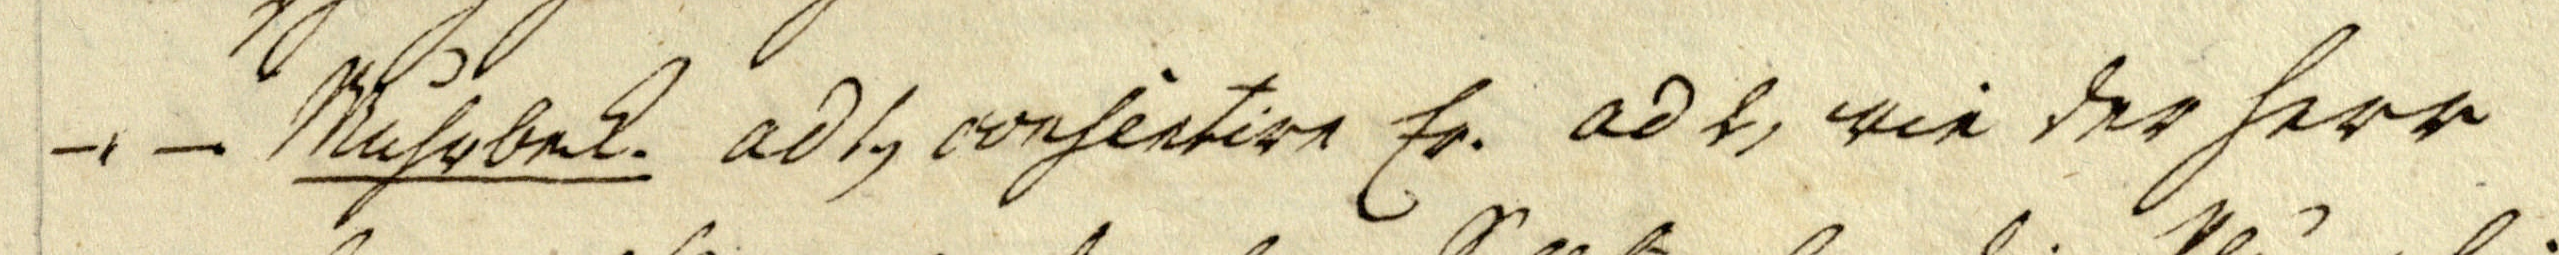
Muhrbeck. ad 1., consentire Er. ad 2, wie der Herr
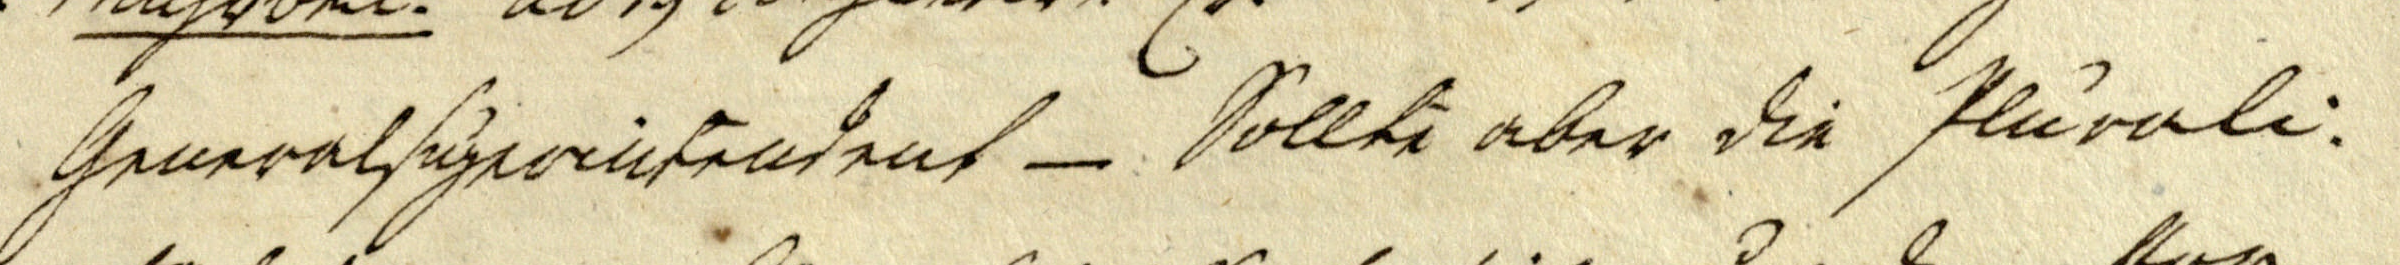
Generalsuperintendent Sollte aber die Plurali¬
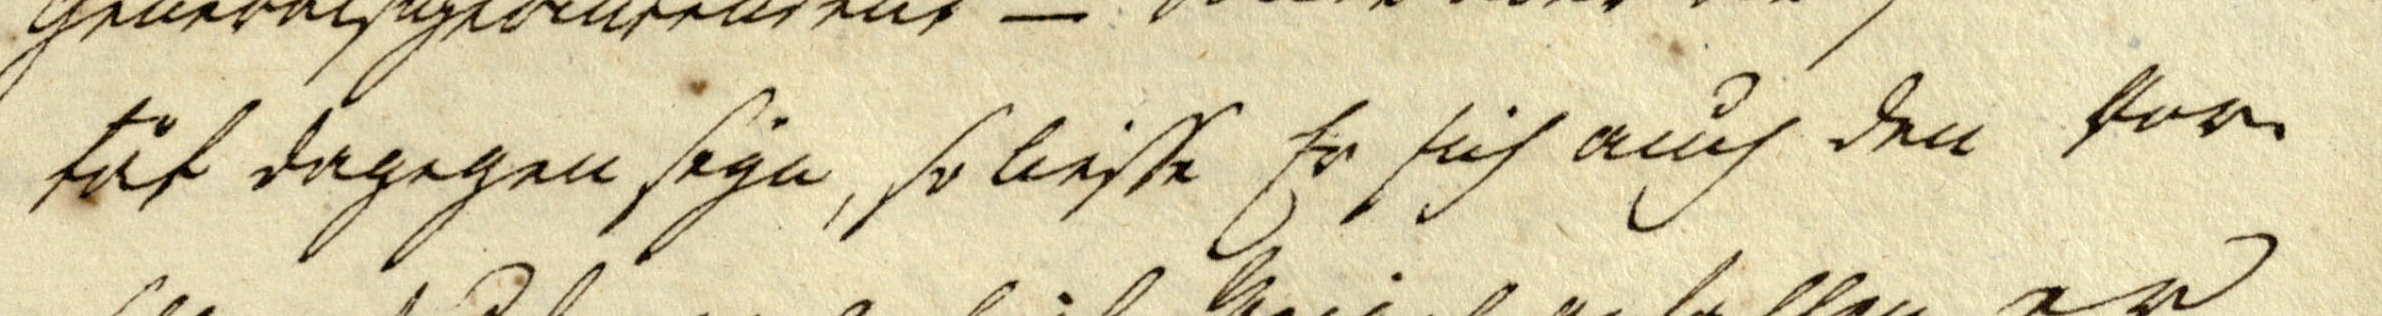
tät dagegen seÿn, so liesse Er sich auch den Vor¬
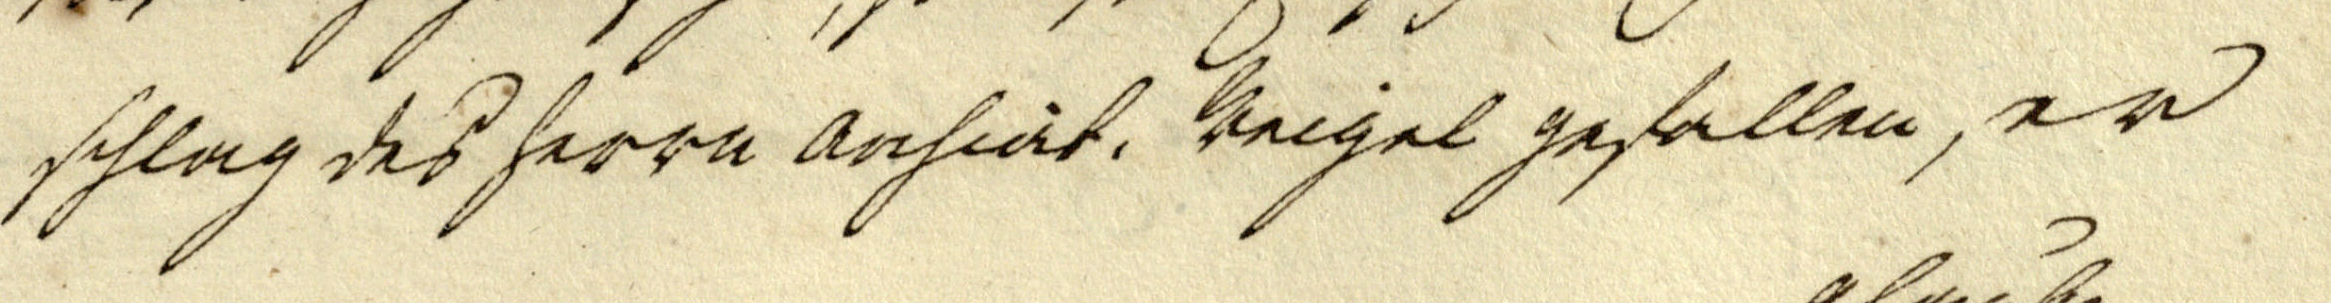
schlag des Herrn Archiat. Weigel gefallen, er
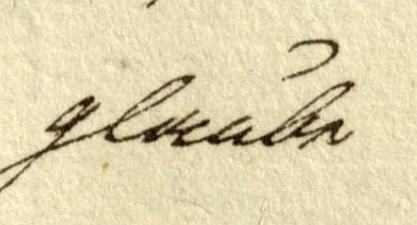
glaube
